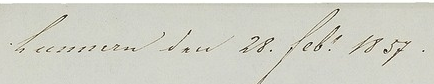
Lunnern den 28. Febr 1857.
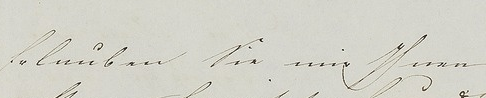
Erlauben Sie mir Ihnen
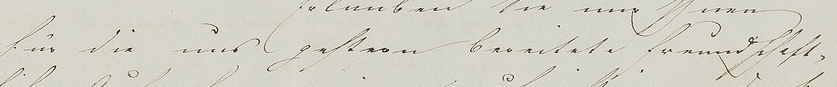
für die uns gestern bereitete freundschaft-
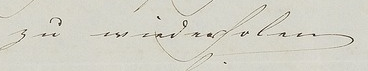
zu wiederholen.
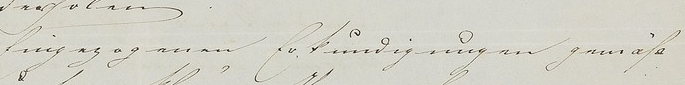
Eingezogenen Erkundigungen gemäß
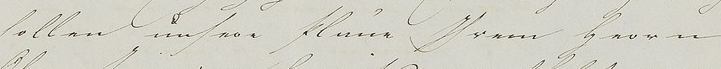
sollen unsere Pläne Ihrem Herrn
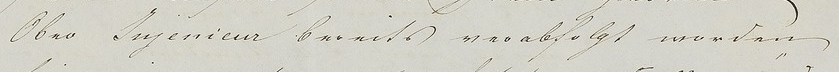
Ober Injenieur bereits verabfolgt worden
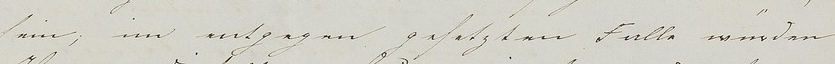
sein; im entgegen gesetzten Falle würden
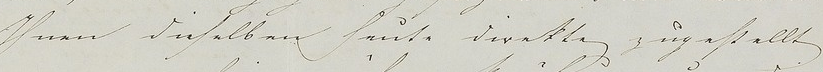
Ihnen dieselben heute direkte zugestellt.
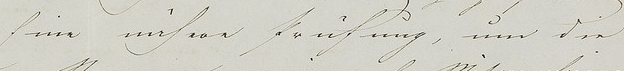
Eine nähere Prüfung, um die
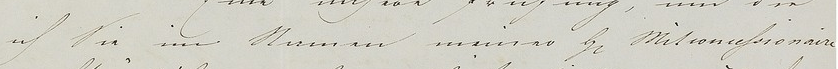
ich Sie im Namen meiner Herren Mitconcessionaire?
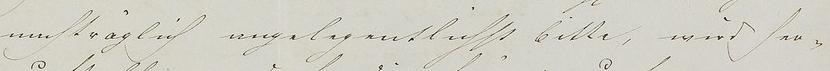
nachträglich angelegentlichst bitte, wird her-
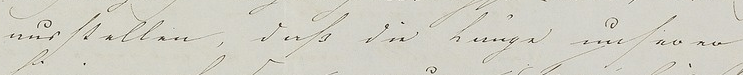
ausstellen, daß die Länge unserer
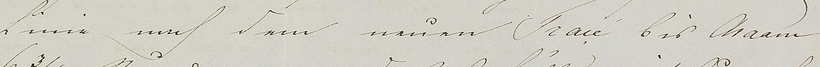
Linie nach dem neuen Tracé bis Aarau
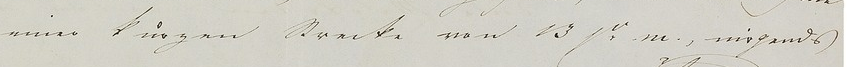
einer kurzen Strecke von ⅓ pr m., nirgends
